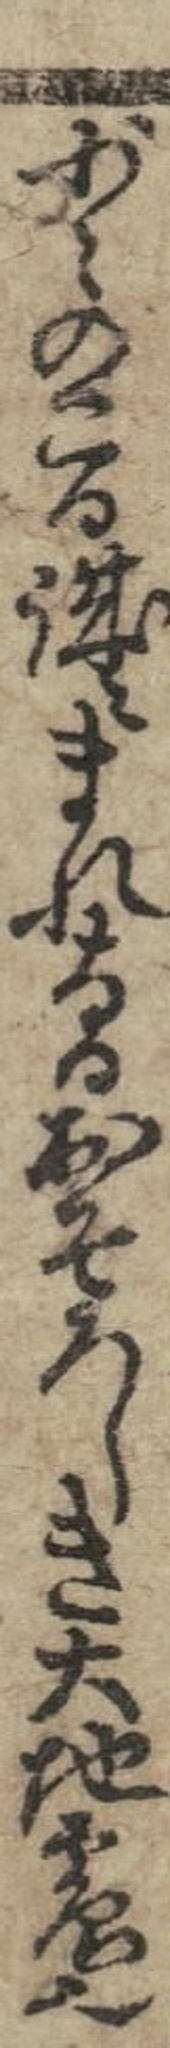少〻のこる誠にまれなるおそろしき大地震也
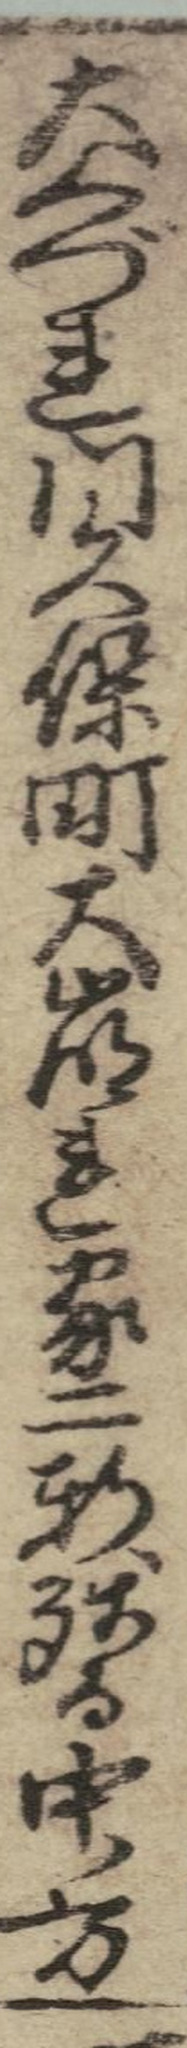大くづれ川久保町大崩れ家ニ軒残る中ノ方
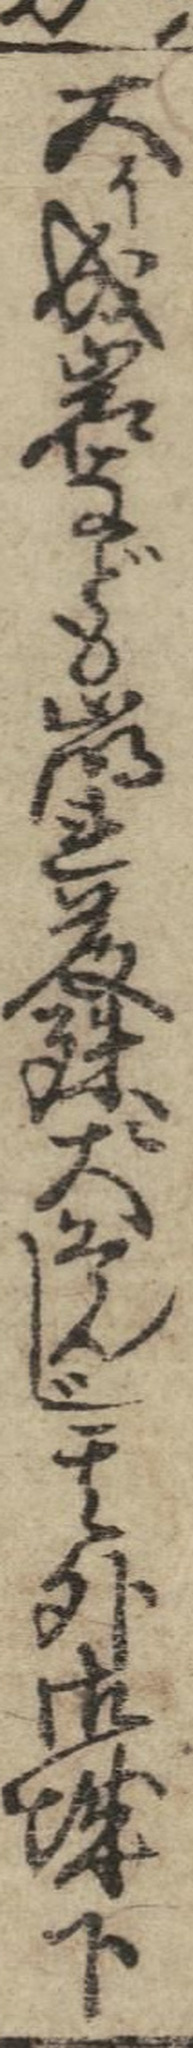大イ成岩なども崩れ落殊に大そんじ其外御城下
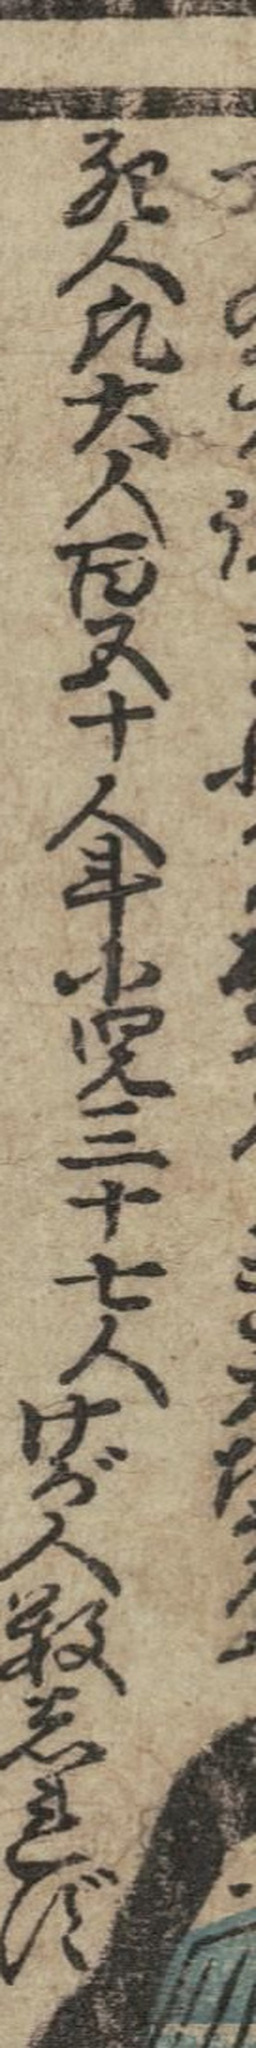死人凡大人百五十人計小児三十七人けが人数しれず
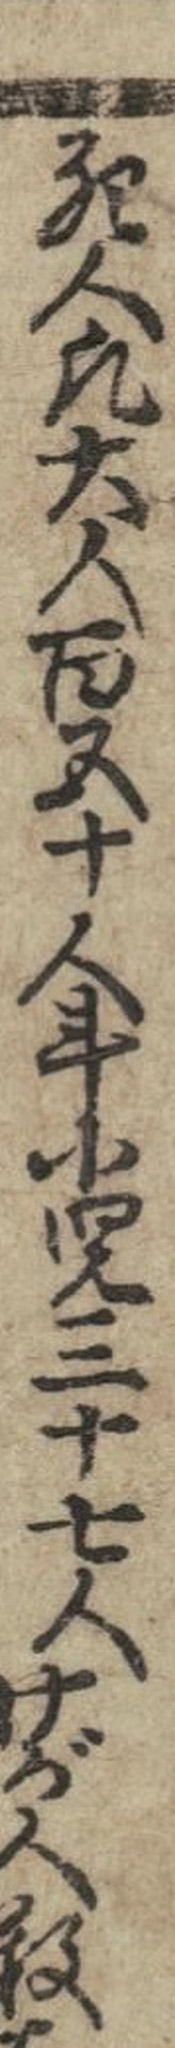死人凡大人百五十人計小児三十七人けが人数しれず
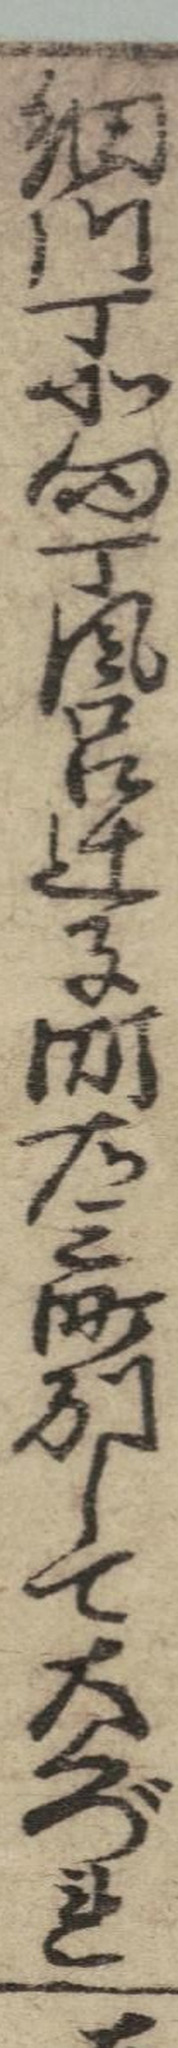北向丁風呂辻子町右三町別して大くづれ
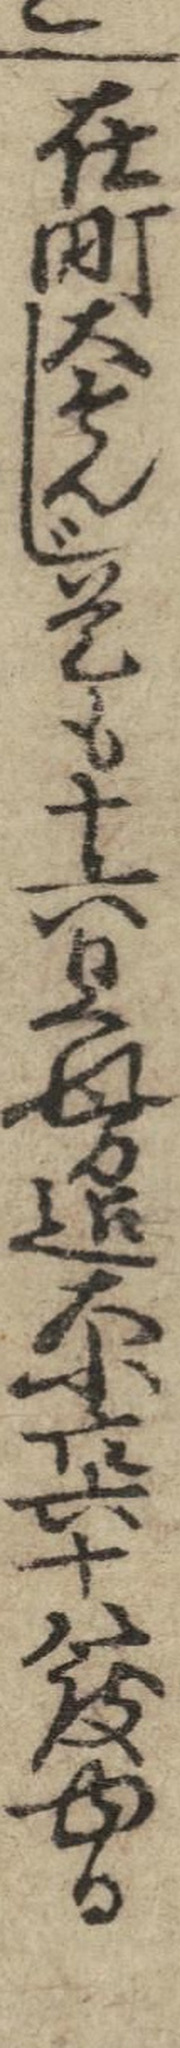在町大そんじ是も十六日くれ方迄大小共六十八度ゆる
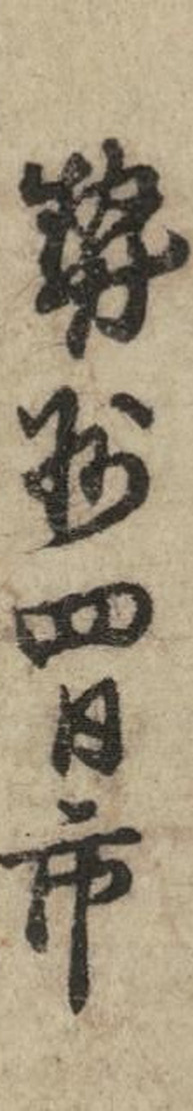勢州四日市
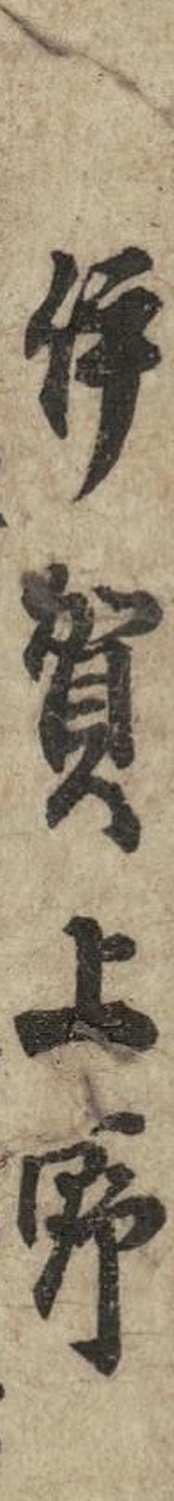伊賀上野
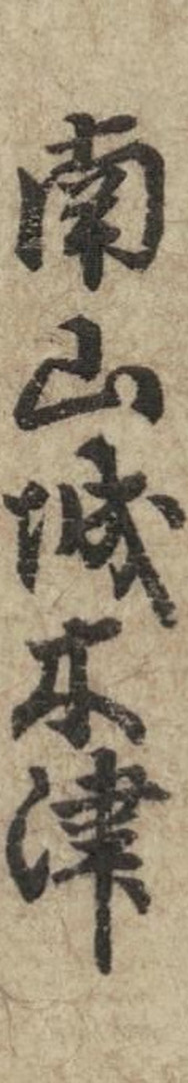南山城木津
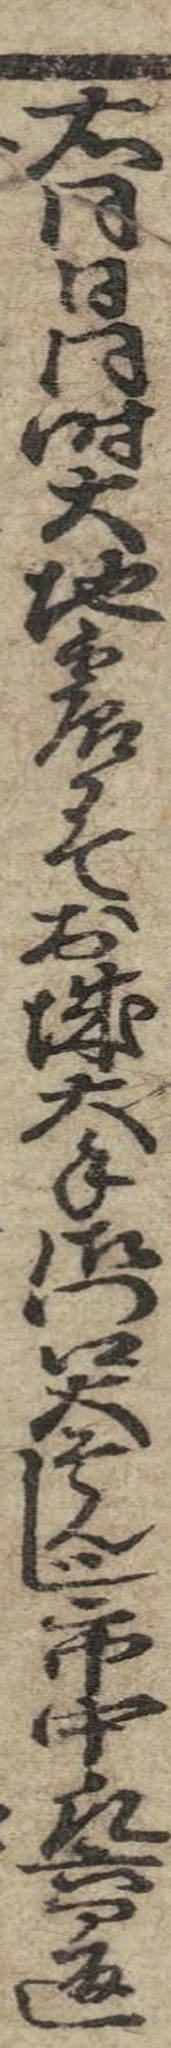右同日同時大地震にてお城大手御門口大そんじ市中凡そ六戸通
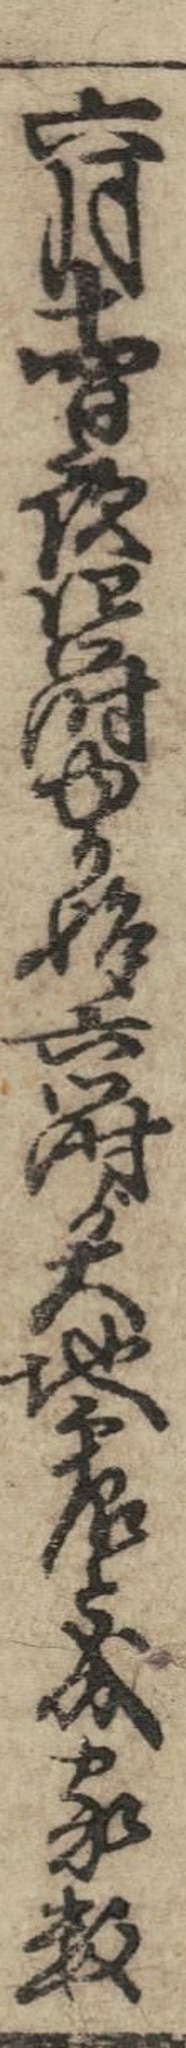六月十四日夜四ツ時ゆり始め六ツ時ゟ大地震に成家数
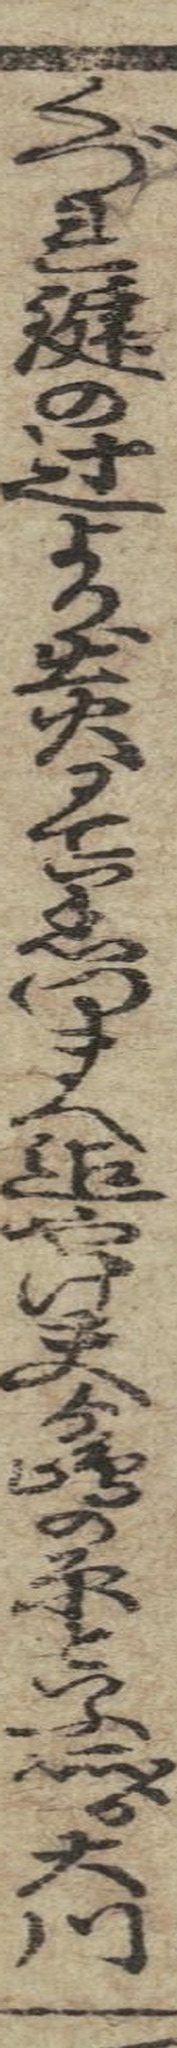くづれ鍵の辻より出火にて黒門まへ迄やけ夫ゟ嶋の原といふ処ゟ大川
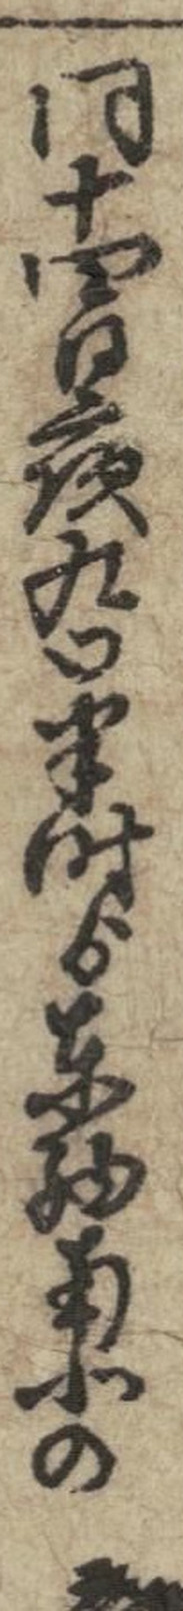同十四日夜九ツ半時ゟ東西南北の
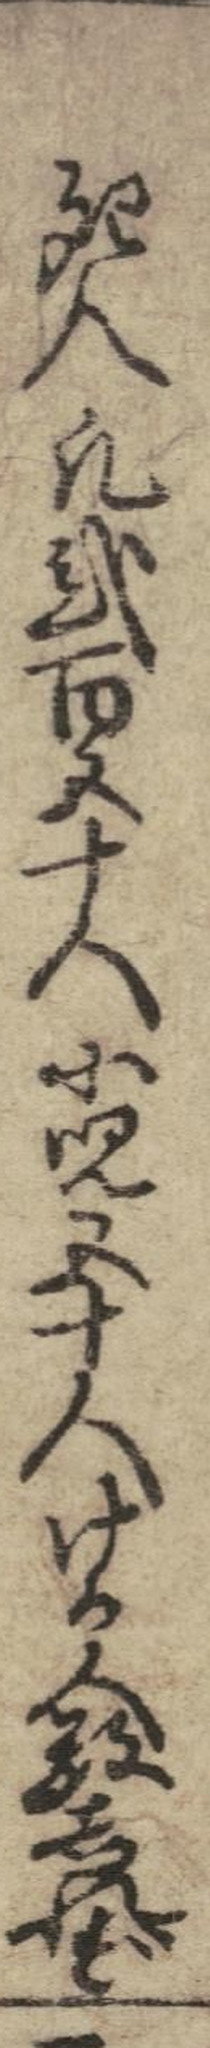死人凡弐百五十人小児五十人けが人数しれず
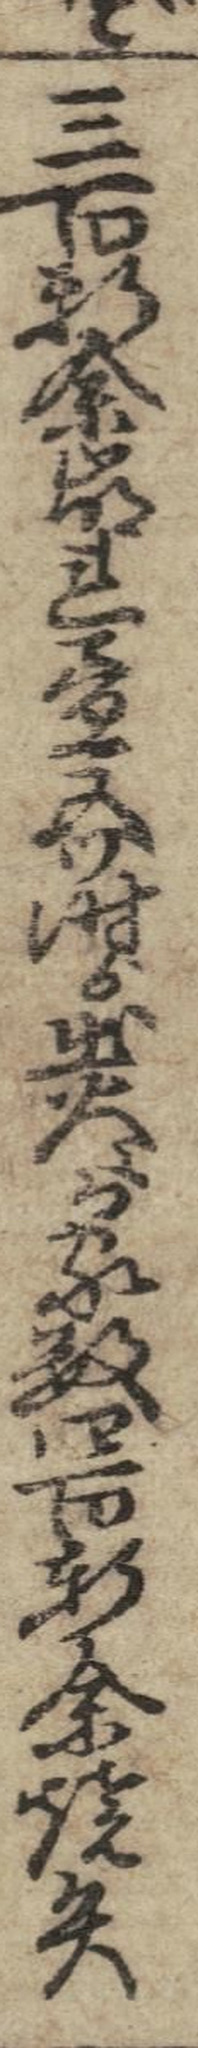三百軒余崩れ昼五ツ時ゟ出火にて家数四百軒余焼失
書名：聞書　諸國大地震并ニ出火・早飛脚廻りにてくわしき所本しらべ　大地震・山城勢州大和三河江州越前　聞書　大地震並ニ出火の次第
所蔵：東京大学地震研究所図書室 Earthquake Research Institute Library, The University of Tokyo, JAPAN
